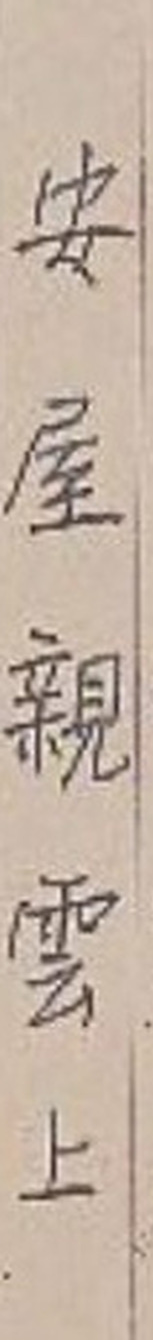安屋親雲上
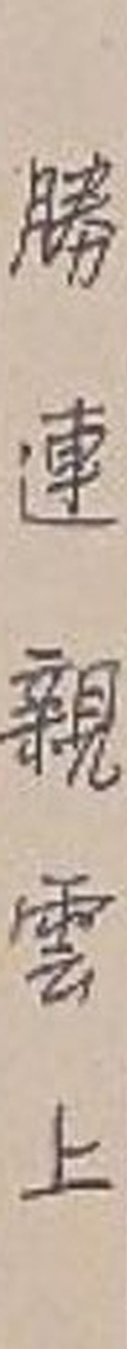勝連親雲上
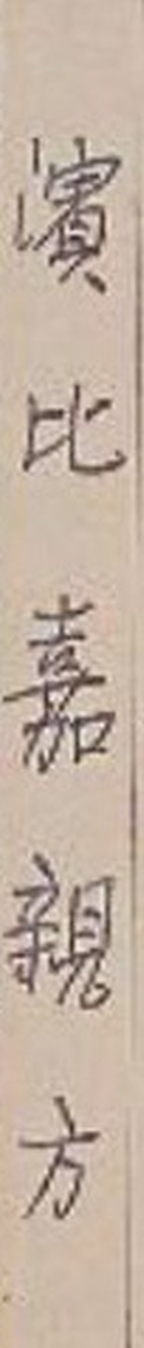浜比嘉親方
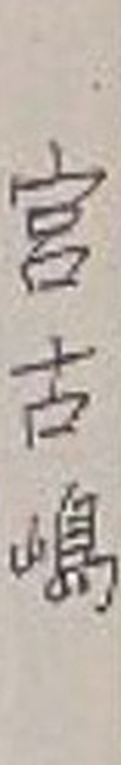宮古島
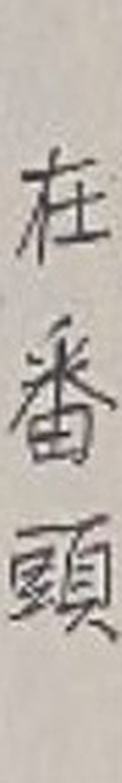在番頭
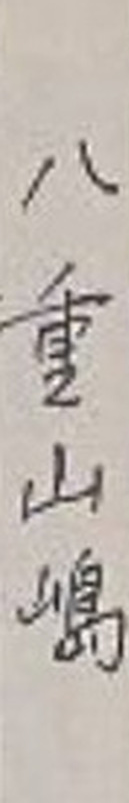八重山島
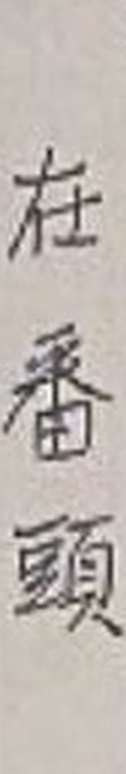在番頭
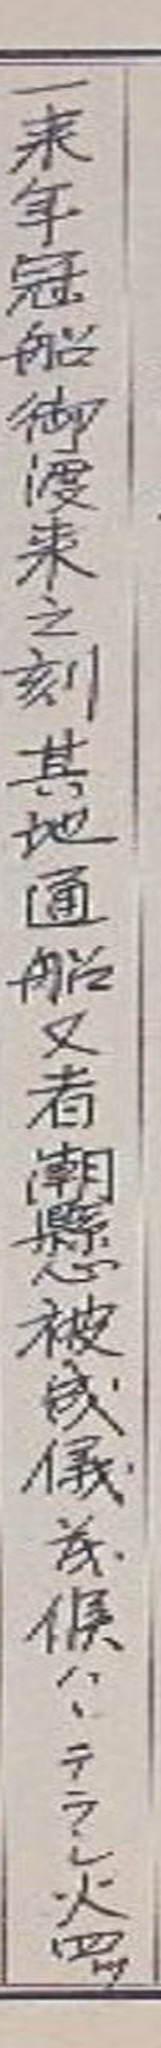一来年冠船御渡来之刻其地通船又者潮懸被成儀も候はゝてらし火四つ
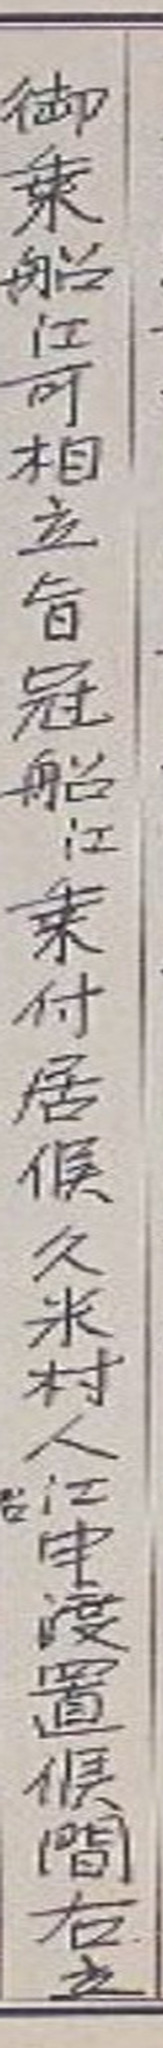御乗船え可相立旨冠船え乗付居候久米村人え申渡置候間右立
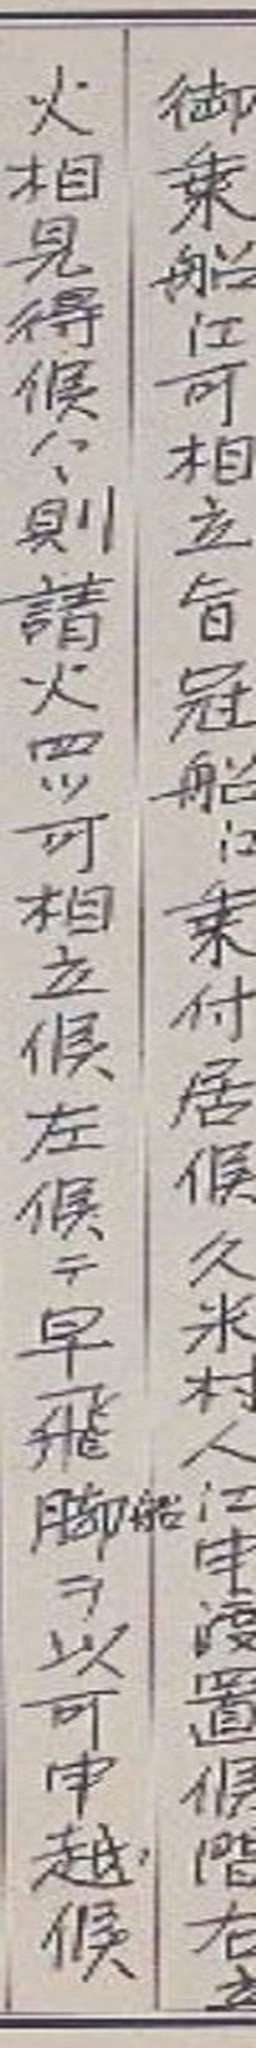火相見得候はゝ則請火四つ可相立候左候て早飛脚を以可申越候
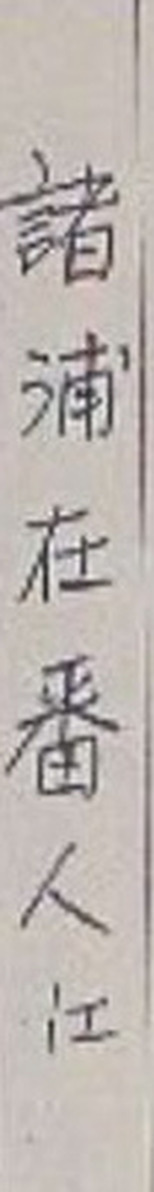諸浦在番人え
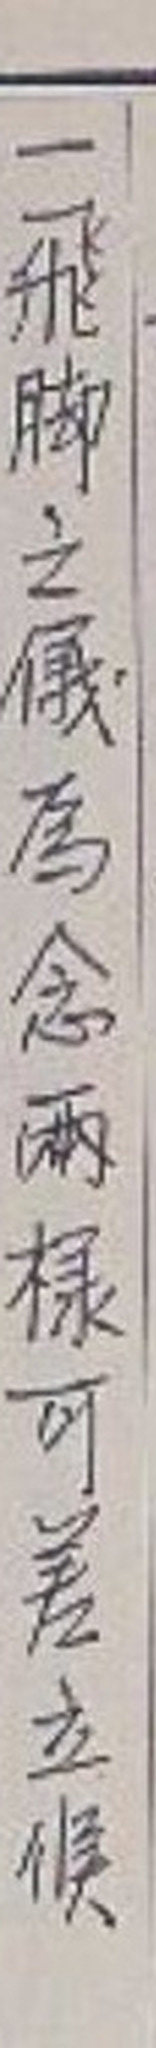一飛脚之儀為念両様可差立候
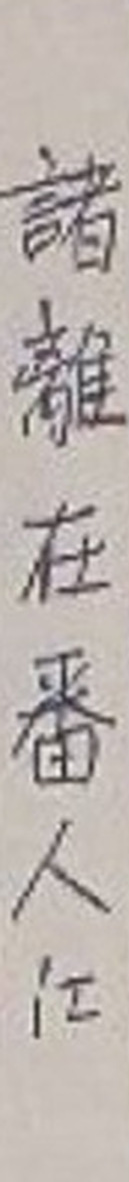諸浦在番人え
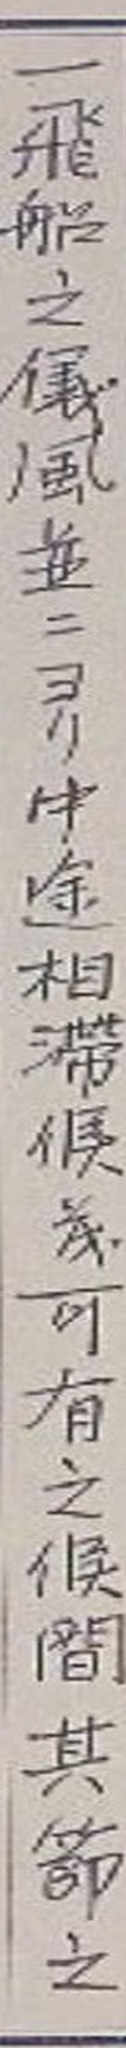一飛船之儀風並により中途相滞候も可有之候間其節之
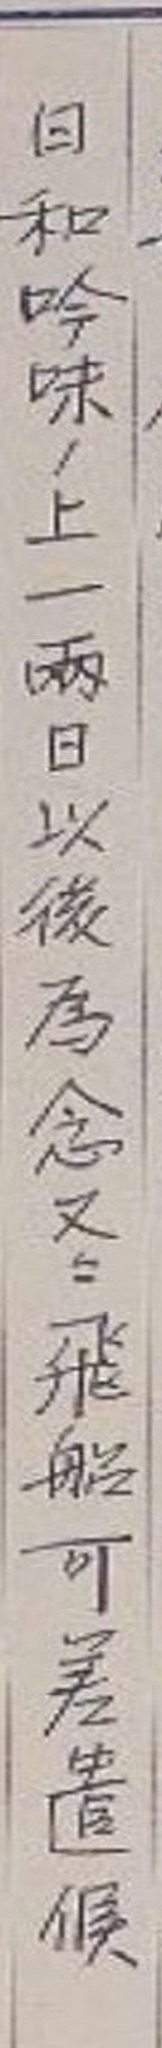日和吟味の上一両日以後為念又々飛船可差遣候

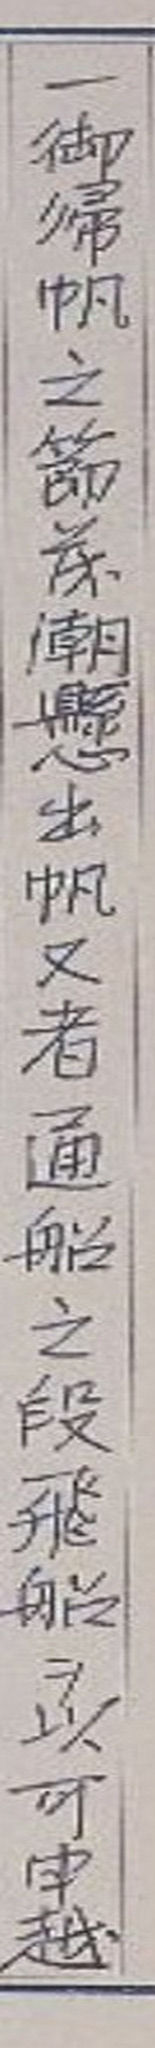一御帰帆之節も潮懸出帆又者通船之段飛船を以可申越
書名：支那冊封使来琉諸記 下巻
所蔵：University of the Ryukyus Library
